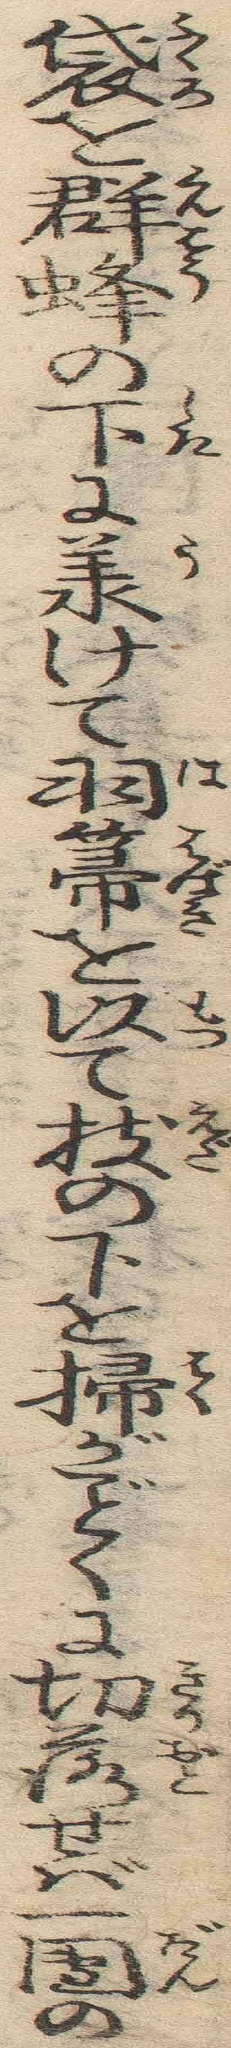袋を群蜂の下に承けて羽箒を以て枝の下を掃がごとくに切落せば一団の
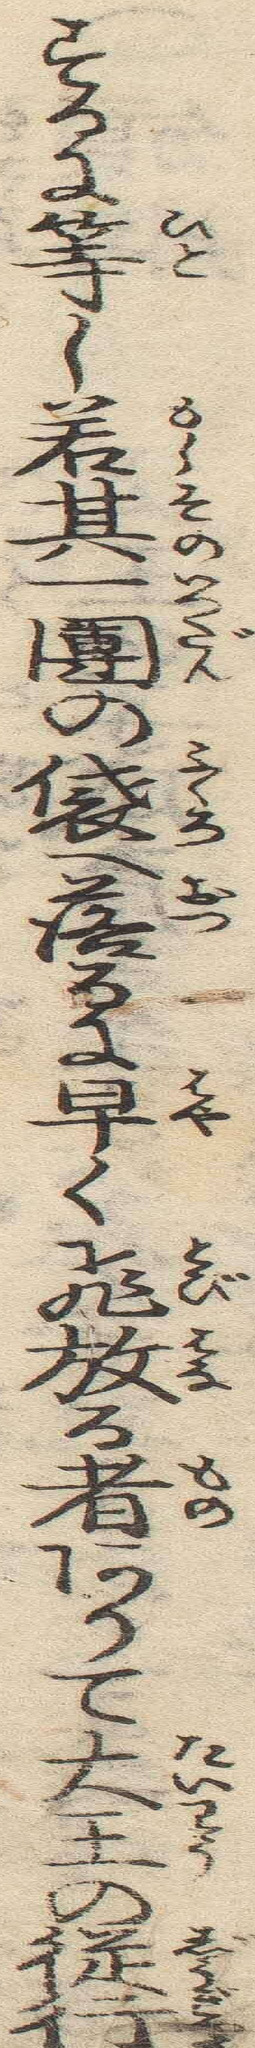するに等し若其一団の袋へ落るに早く飛放る者ありて大王の従行
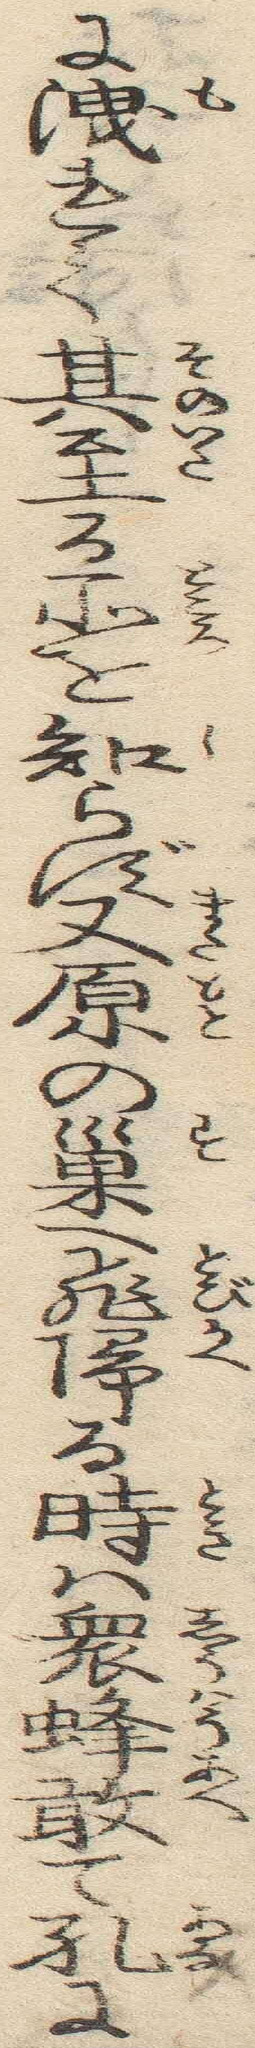に洩れて其至る所を知らず又原の巣へ飛帰る時は衆蜂敢て孔に
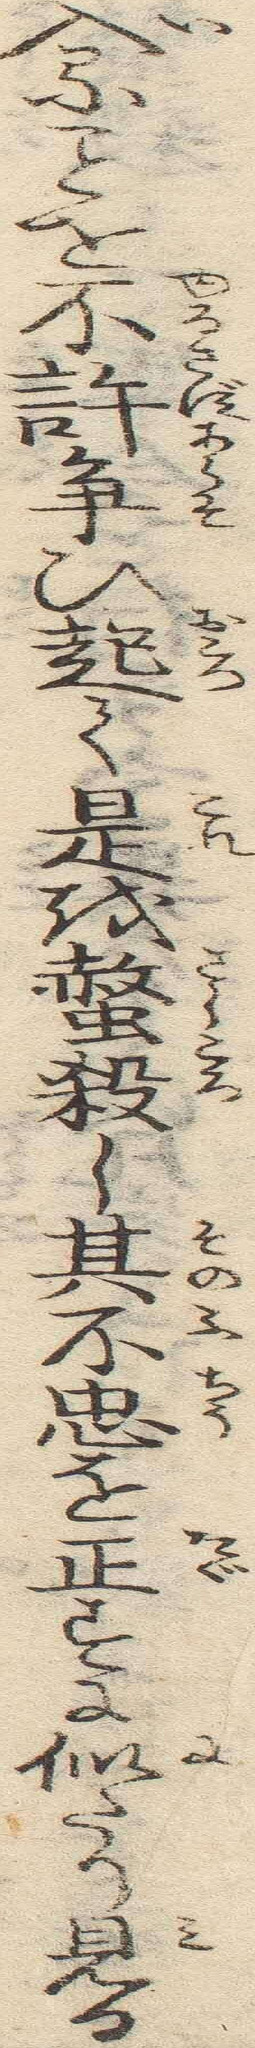入ることを不許争ひ起て是を螫殺し其不忠を正すに似たり見る
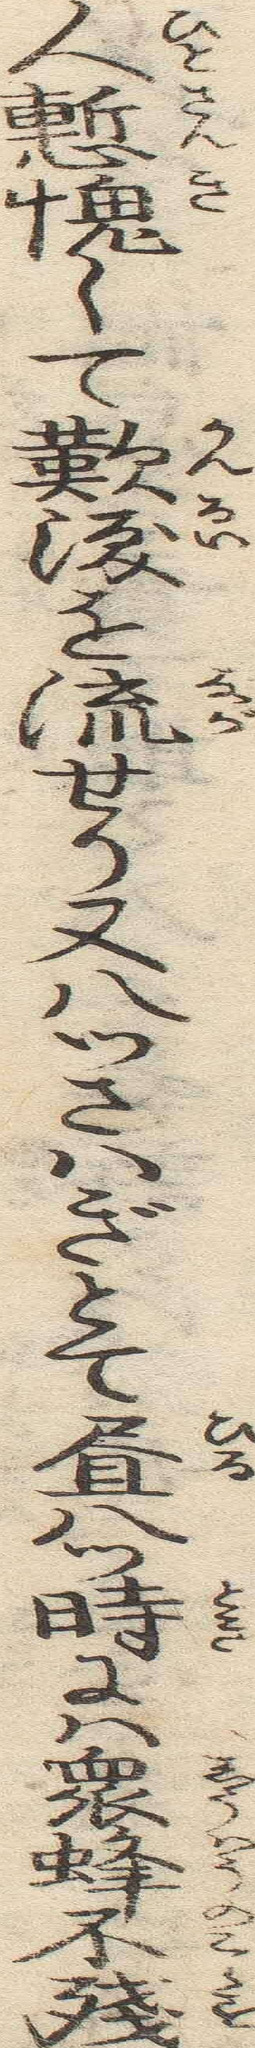人慙愧して歎涙を流せり又八ツさはぎとて昼八ツ時には衆蜂不残
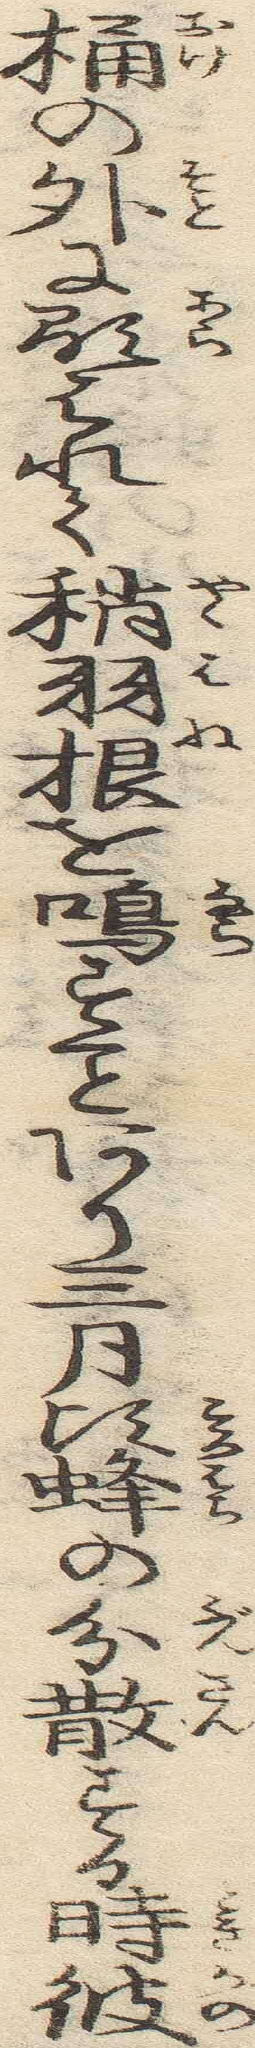桶の外に顕はれて稍羽根を鳴すことあり三月頃蜂の分散する時彼
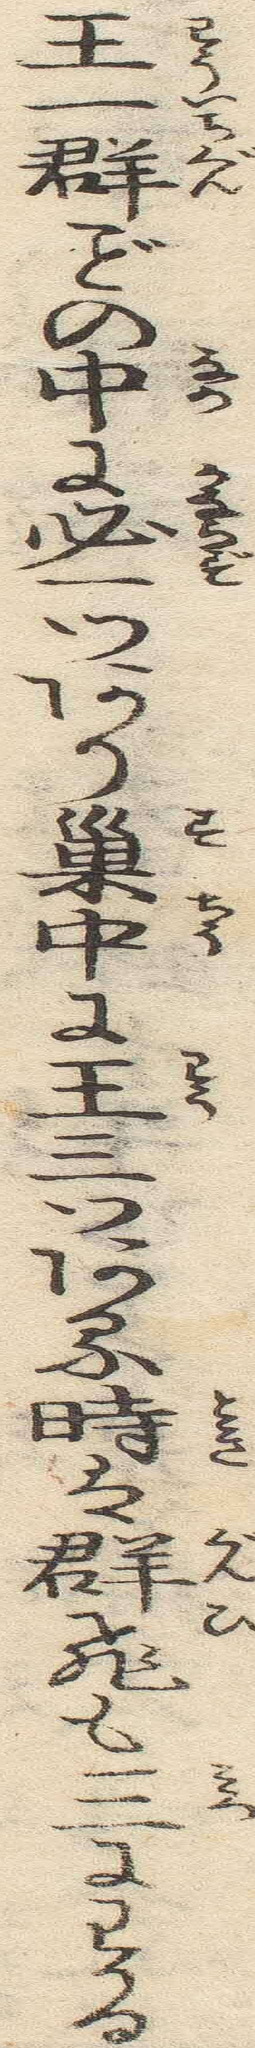王一群ごとの中に必一ツあり巣中に王三ツある時は群飛も三にわかる
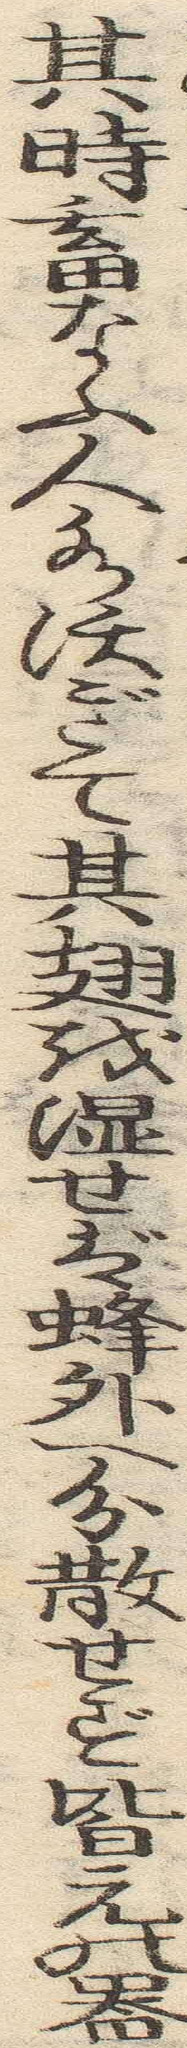其時畜なふ人水沃ぎて其翅を湿せば蜂外へ分散せず皆元の器
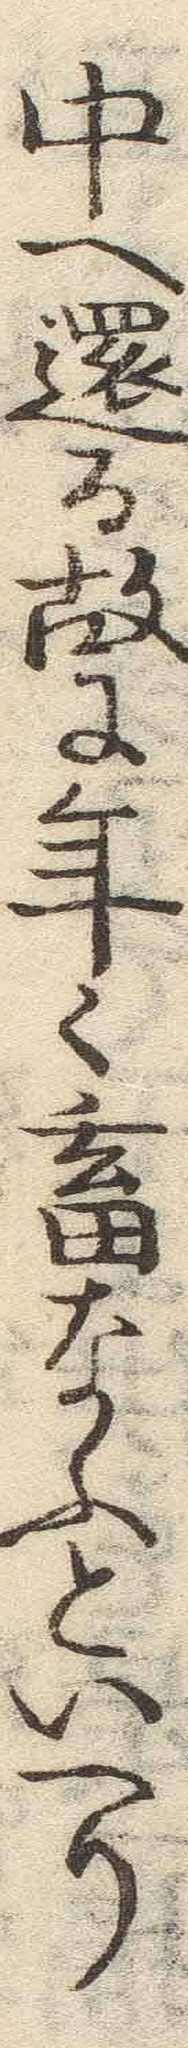中へ還る故に年々畜なふといへり
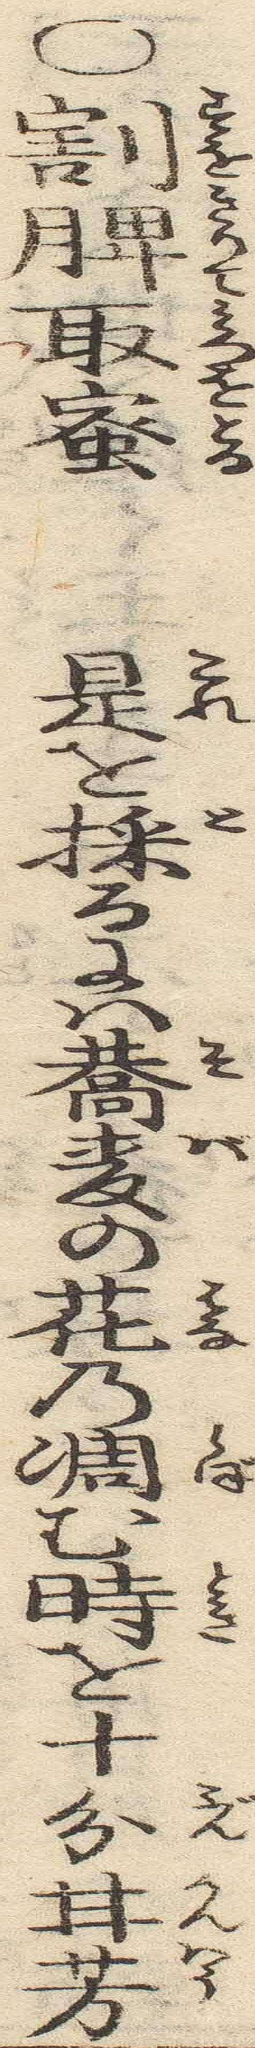○割脾取蜜是を採るには蕎麦の花の凋む時を十分甘芳
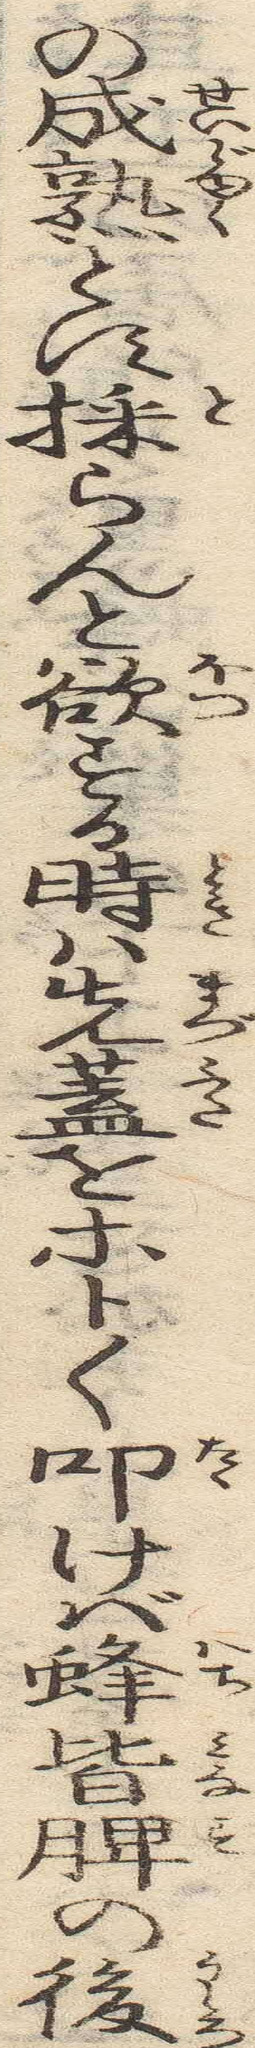の成熟とす採らんと欲する時は先蓋をホト〳〵叩けば蜂皆脾の後
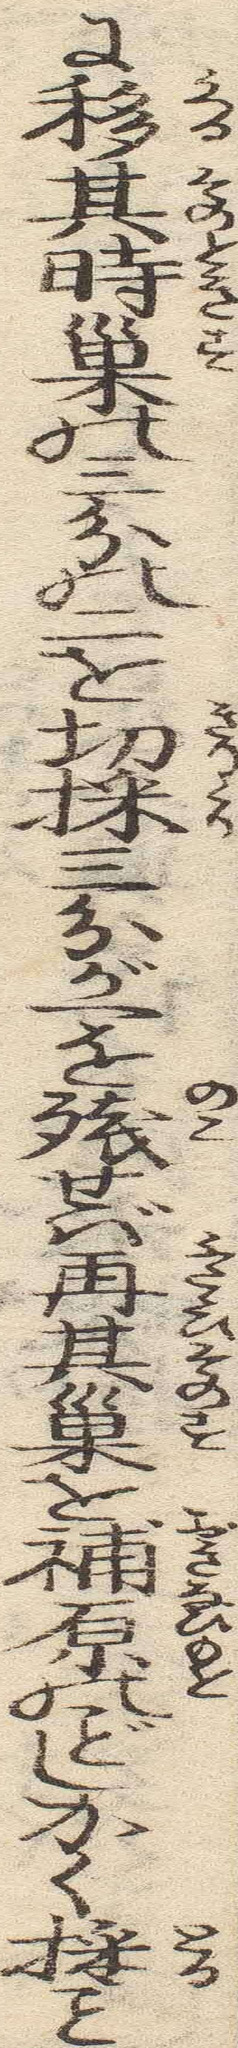に移其時巣の三分の二を切採三分が一を残せば再其巣を補原のごとしかく採こと
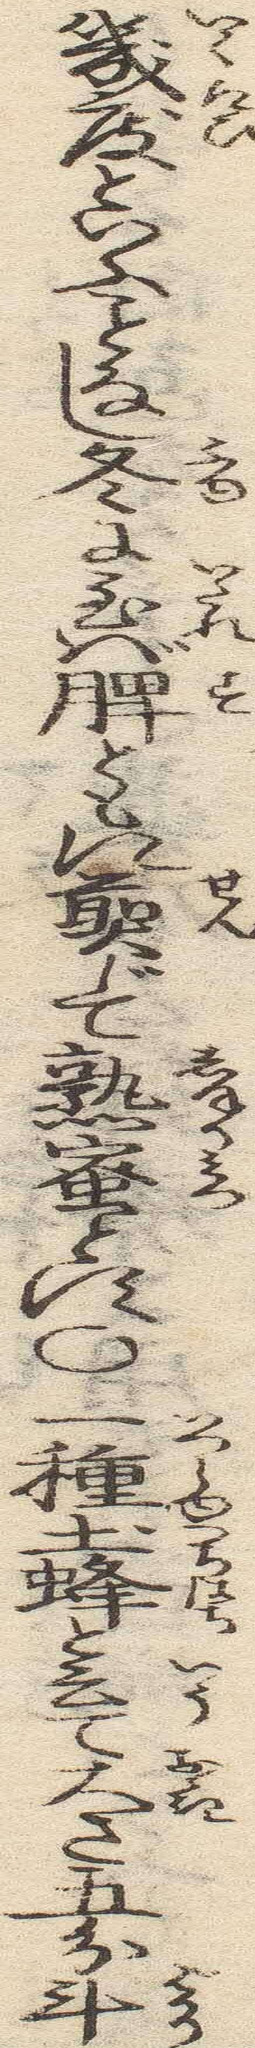幾度といふことなし冬に至ば脾ともに煎じて熟蜜とす○一種土蜂と云て大さ五分斗
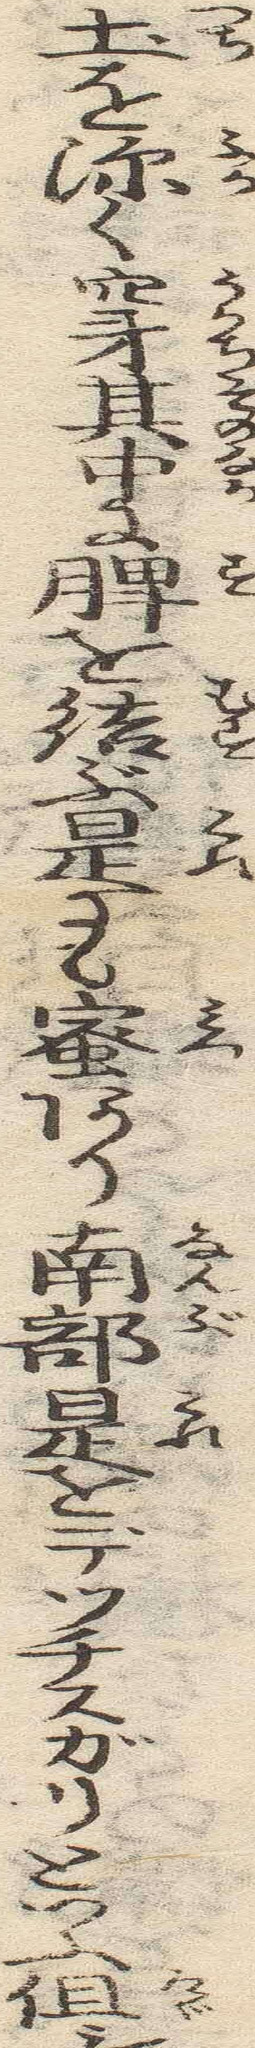土を深く穿其中に脾を結ぶ是にも蜜あり南部是をデツチスガリといふ但し
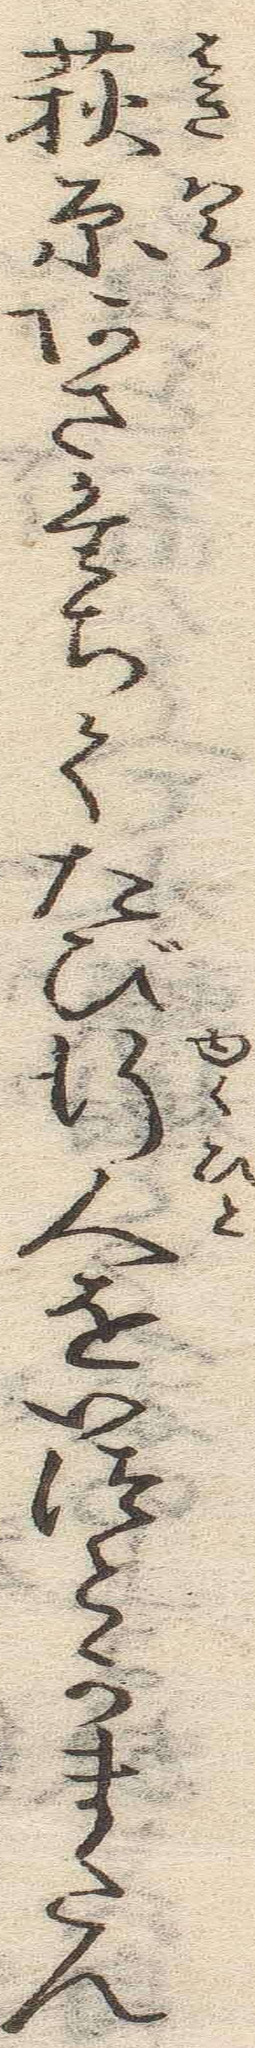萩原あさたちてたび行人をいつとかまたん又深山
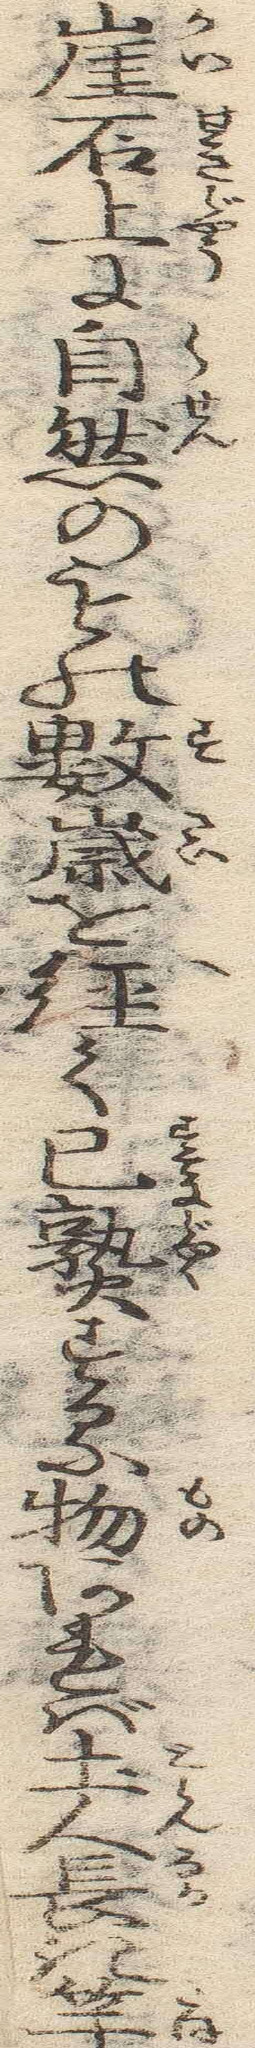崖石上に自然のもの数歳を経て已熟する物あれば土人長き竿
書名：日本山海名産図会
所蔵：東京学芸大学附属図書館 国文学研究資料館
